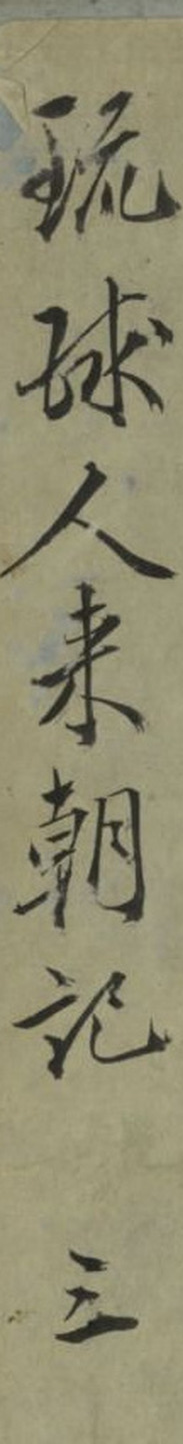琉球人来朝記三

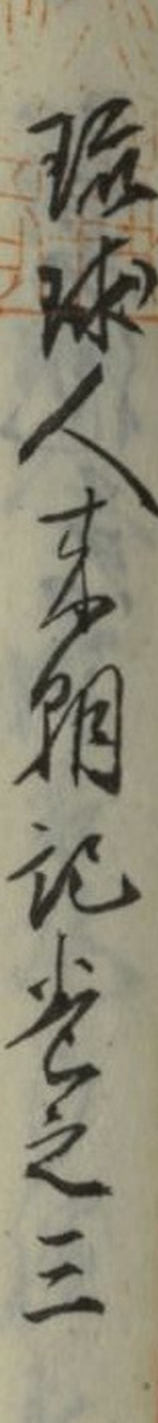琉球人来朝記巻之三
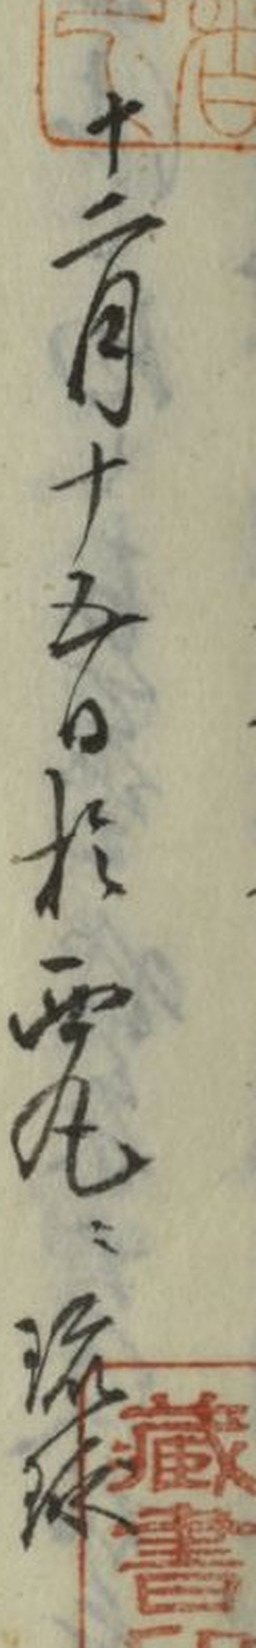十二月十五日於西丸に琉球
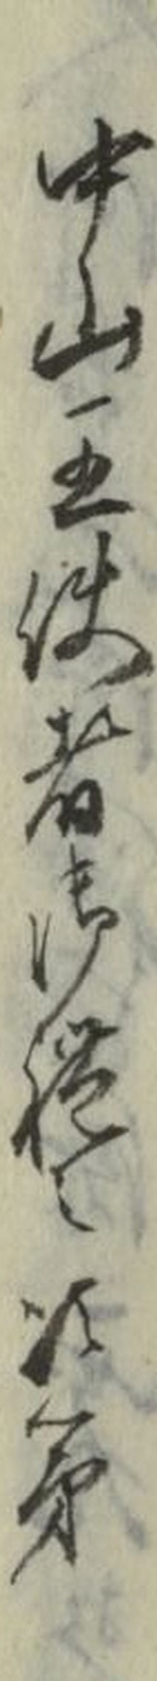中山王使者御礼之次第
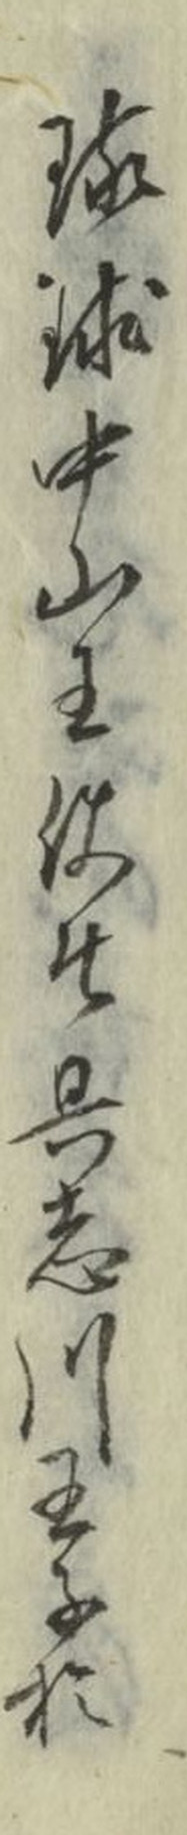琉球中山王使者具志川王子於
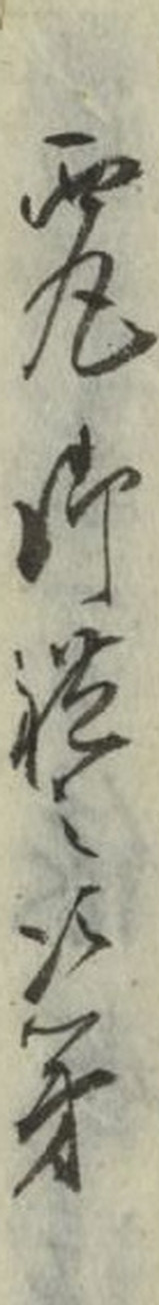西丸御礼之次第
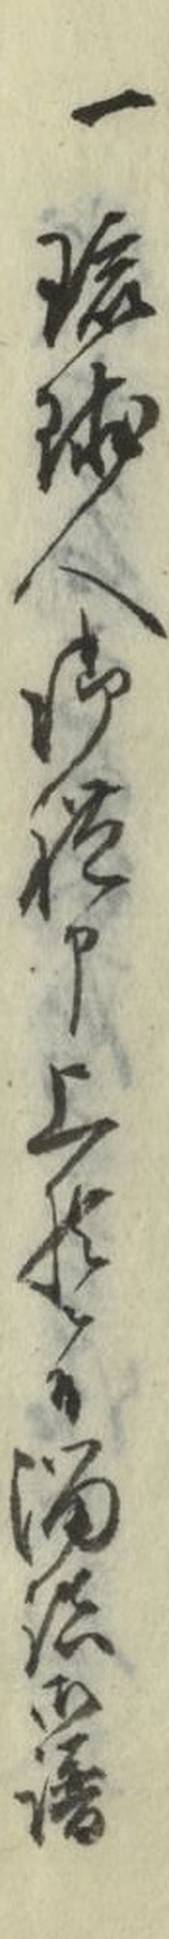一琉球人御礼申上候に付溜詰御譜

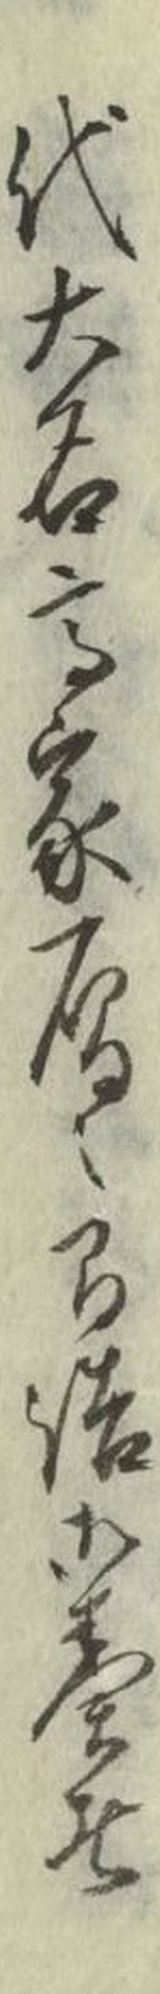代大名高家雁之間詰御奏者
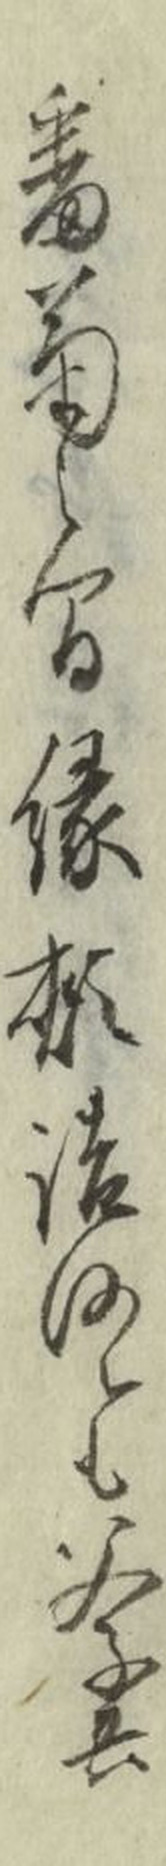番菊之間縁頬詰何れも父子共
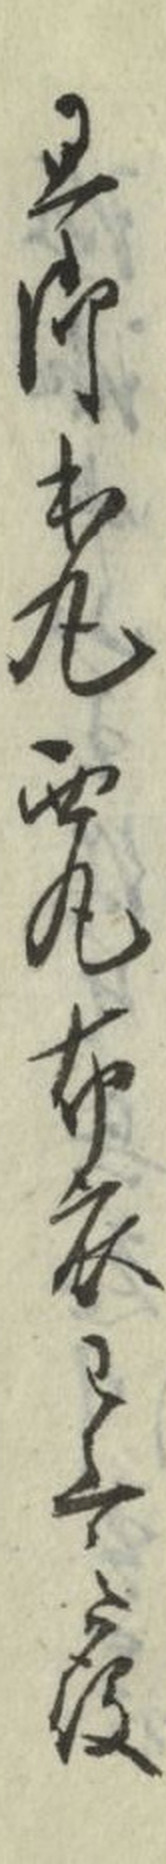且御本丸西丸布衣已上之役
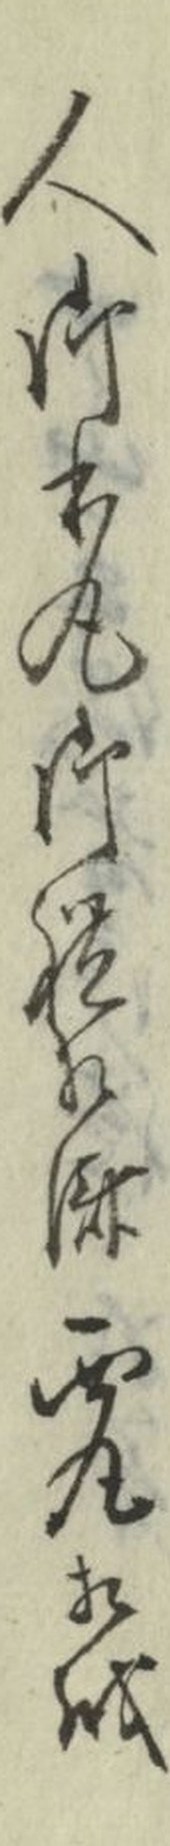人御本丸御礼相済西丸相越
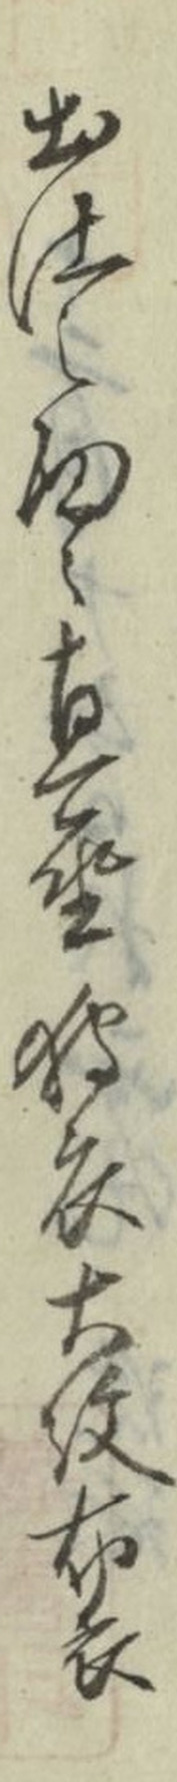出仕之面々直垂狩衣大紋布衣
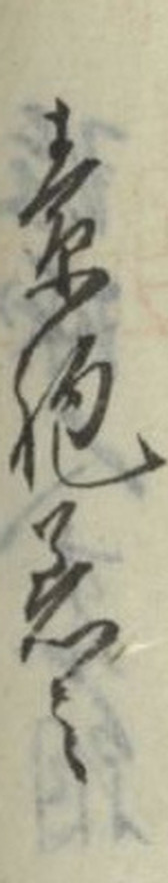素袍着之
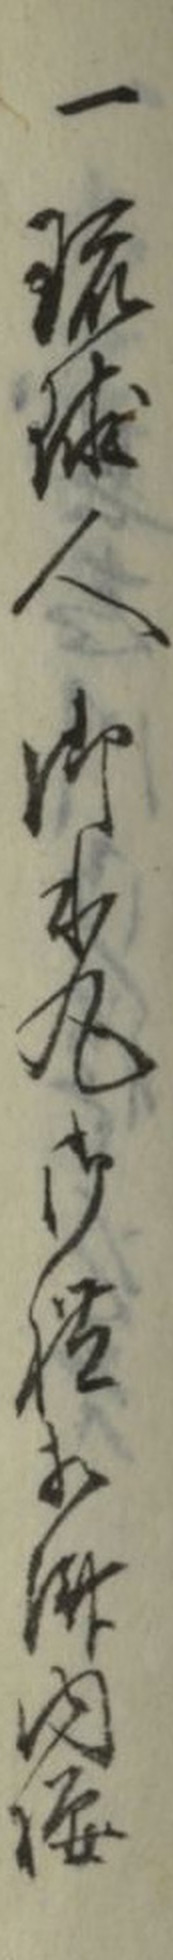一琉球人御本丸御礼相済内桜
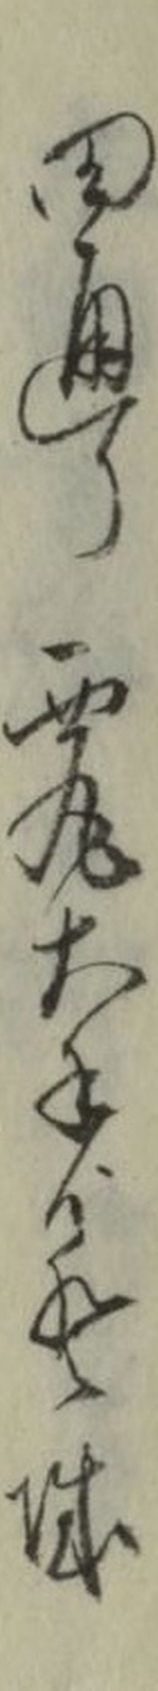田通り西丸大手ゟ登城
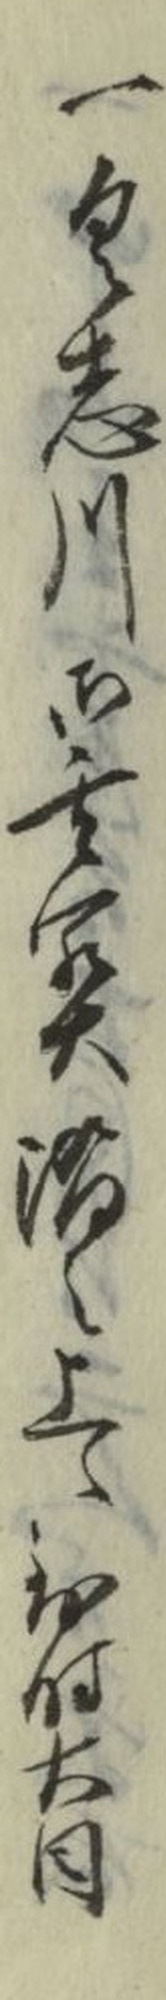一具志川御玄関階之上に至時大目
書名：琉球人来朝記 三
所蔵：University of the Ryukyus Library
